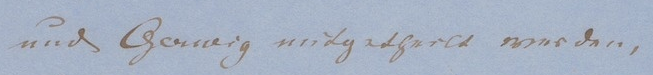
und Gerwig mitgetheilt werden,
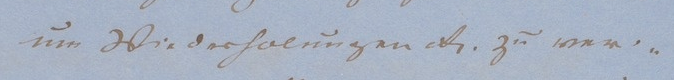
um Wiederholungen etc. zu ver-
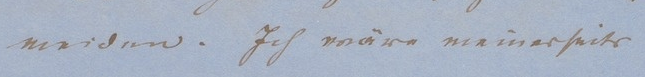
meiden. Ich wäre meinerseits
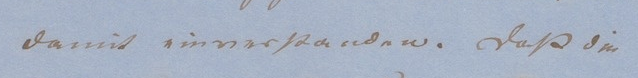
damit einverstanden. Daß die
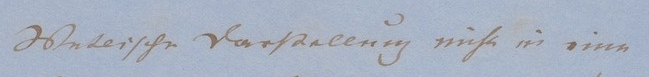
Wetlische Darstellung nicht in eine
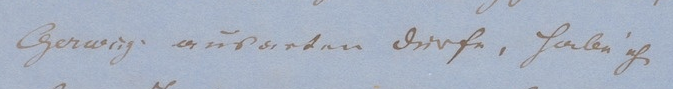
Gerwig ausarten dürfe, habe ich
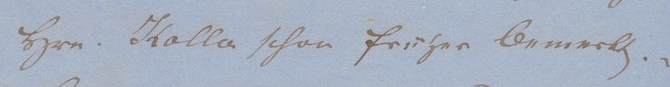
Hrn. Koller schon früher bemerkt. –
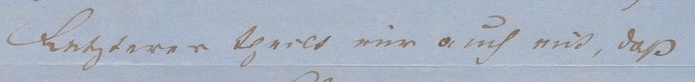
Letzterer theilt mir auch mit, daß
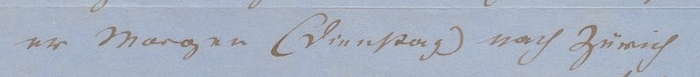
er Morgen (Dienstag) nach Zürich
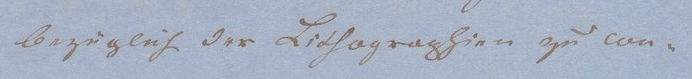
bezüglich der Lithographien zu con-
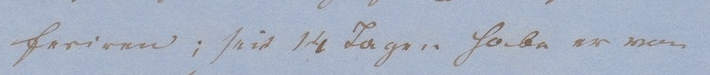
feriren; seit 14 Tagen habe er von
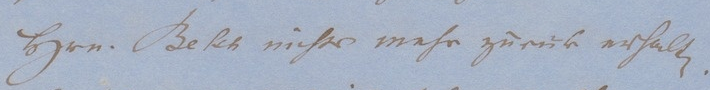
Hrn. Bekh nichts mehr zurük erhalten.
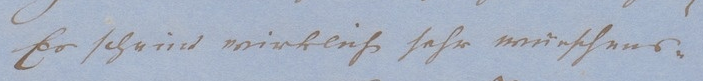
Es scheint wirklich sehr wünschens-
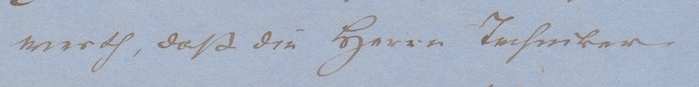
werth, daß die Herrn Techniker
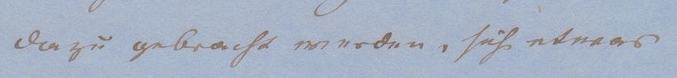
dazu gebracht werden, sich etwas
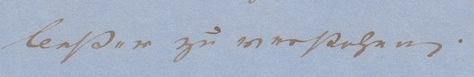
beßer zu verstehen. –
